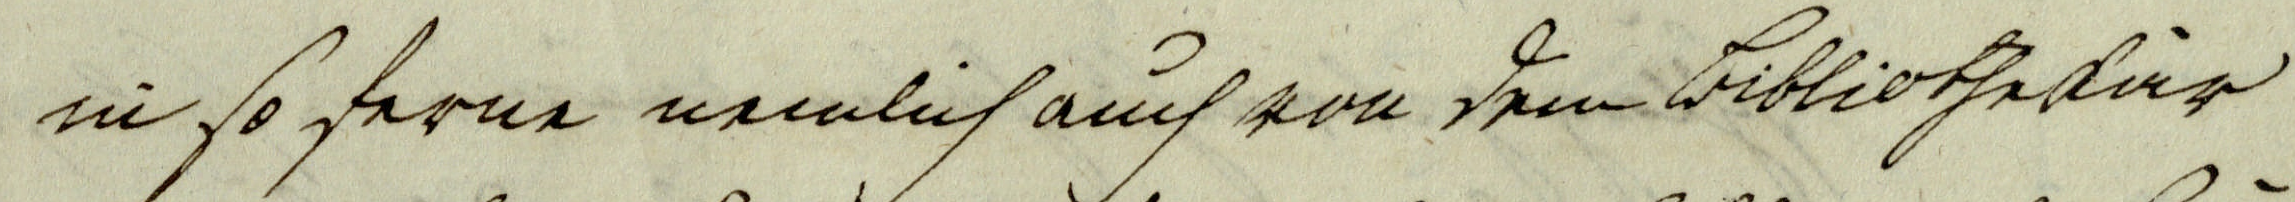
in so ferne nemlich auch von dem Bibliothekar
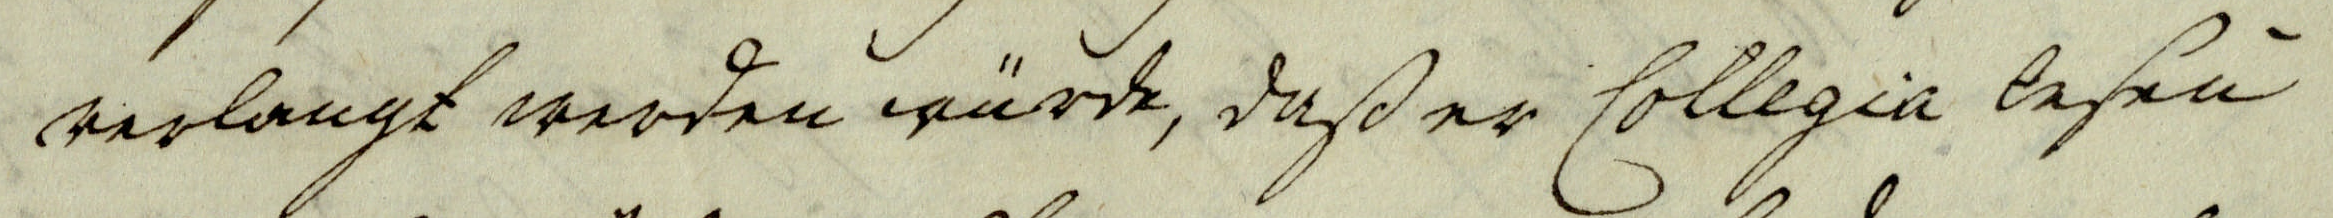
verlangt werden würde, daß er Collegia lesen
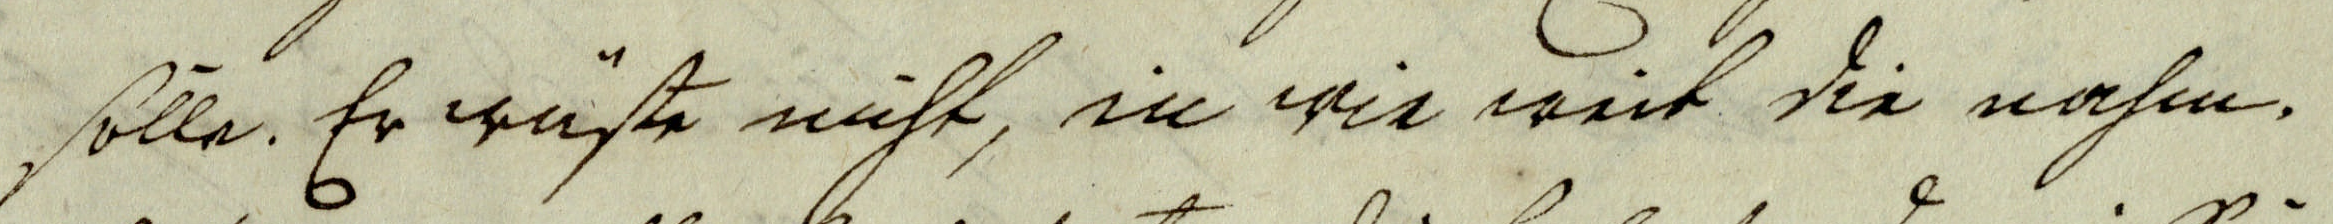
solle. Er wüsste nicht, in wie weit die nahm¬
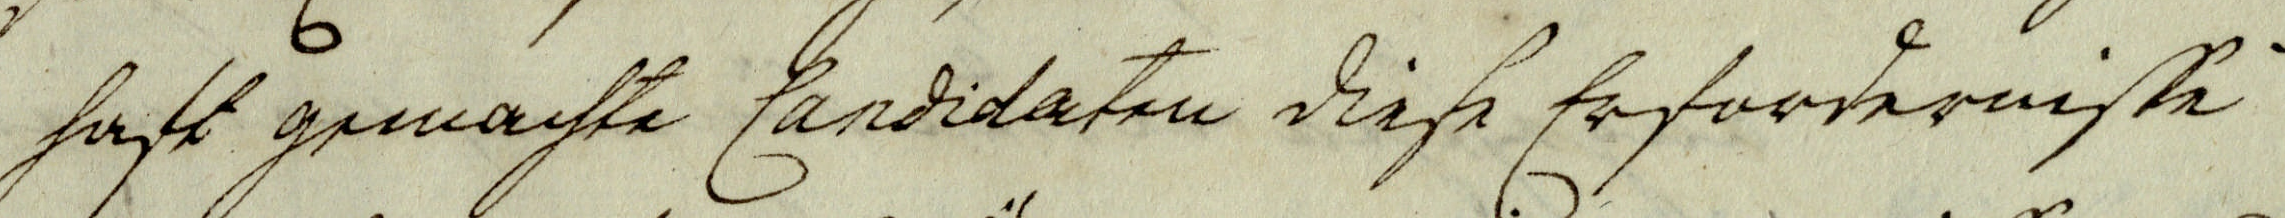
haft gemachte Candidaten diese Erfordernisse
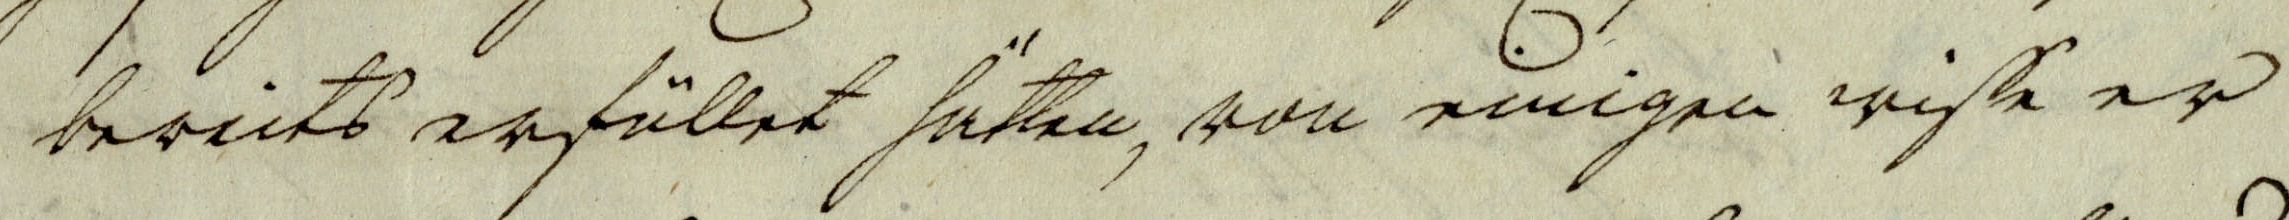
bereits erfüllet hätten, von einigen wisse er
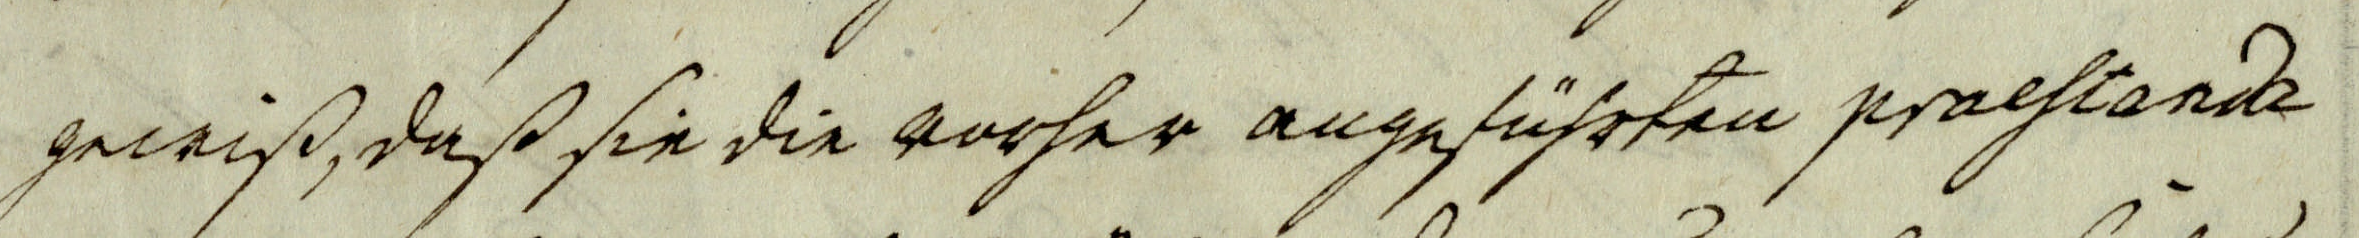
gewiß, daß sie die vorher angeführten praestanda
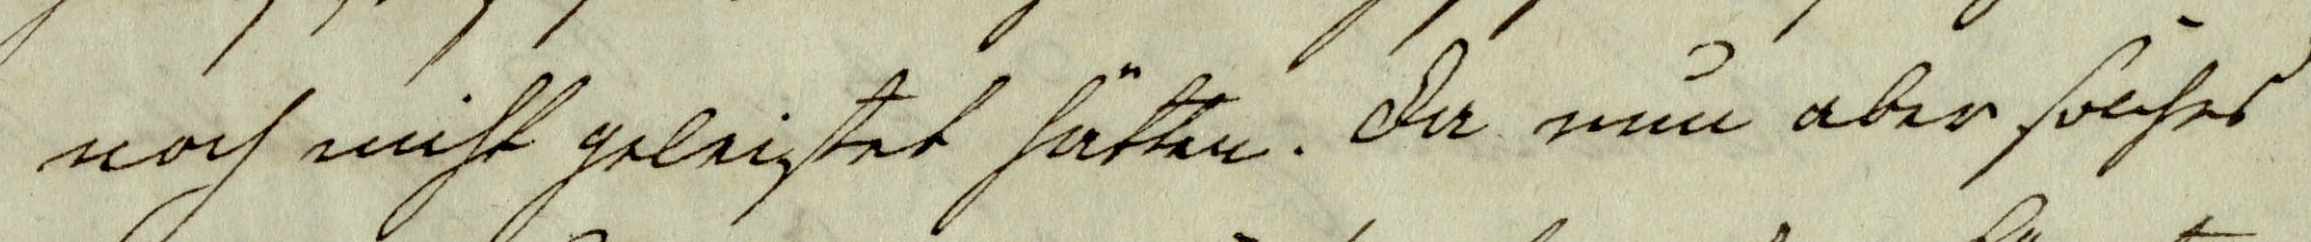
noch nicht geleistet hätten. Da nun aber solches
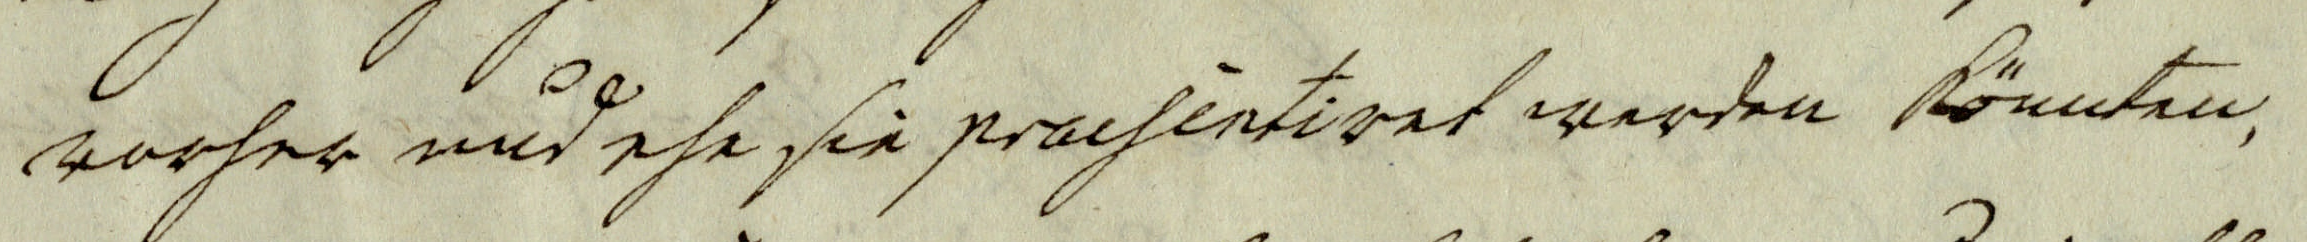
vorher und ehe sie praesentiret werden könnten,
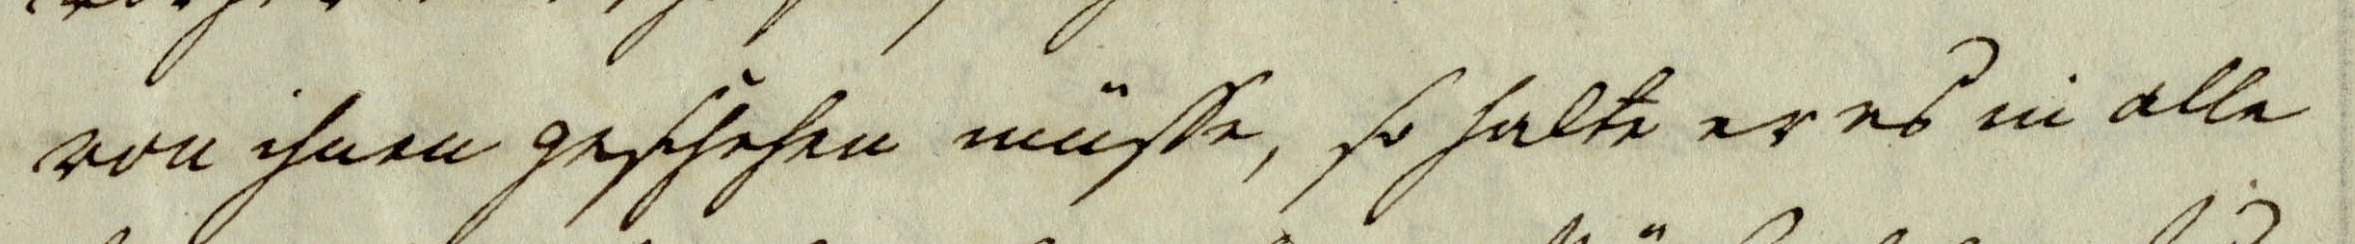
von ihnen geschehen müsse, so halte er es in alle
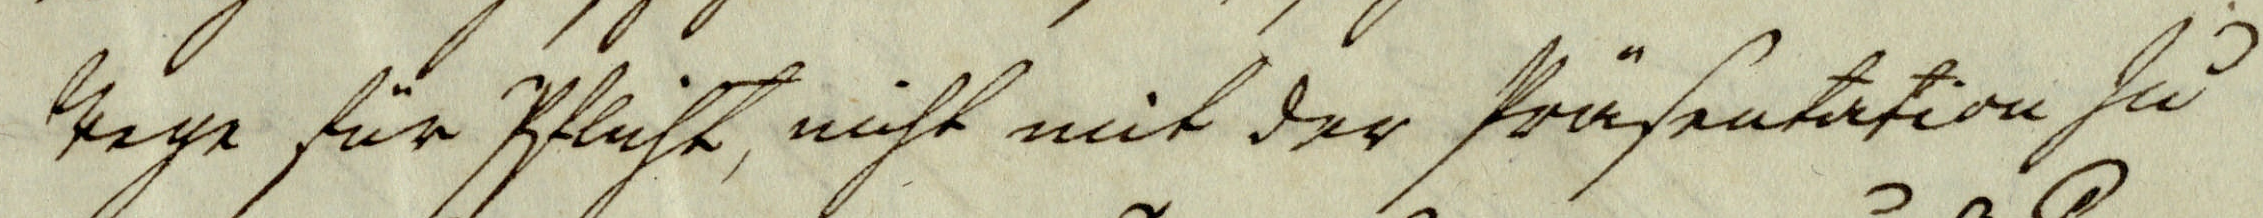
Wege für Pflicht, nicht mit der Präsentation zu
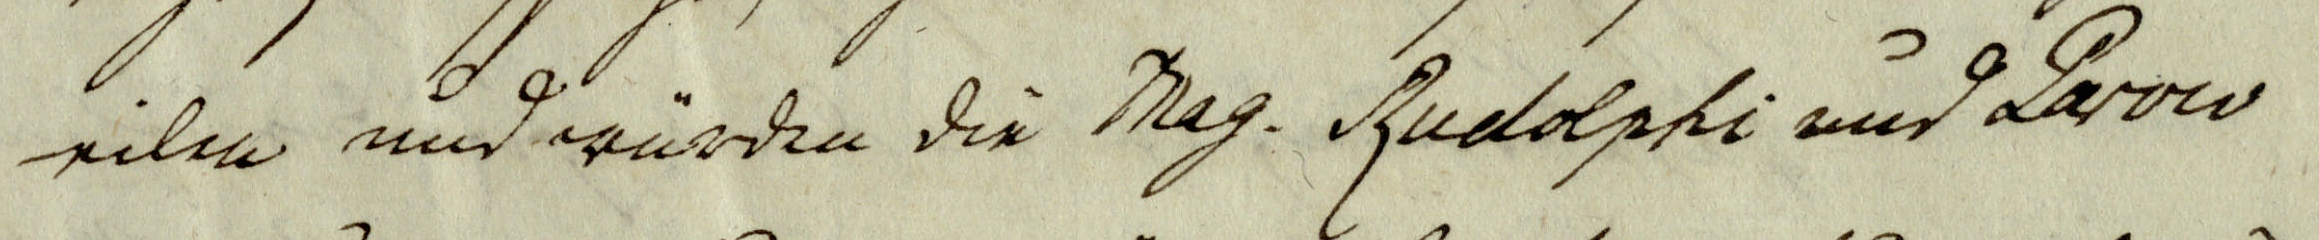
eilen und würden die Mag. Rudolphi und Larow
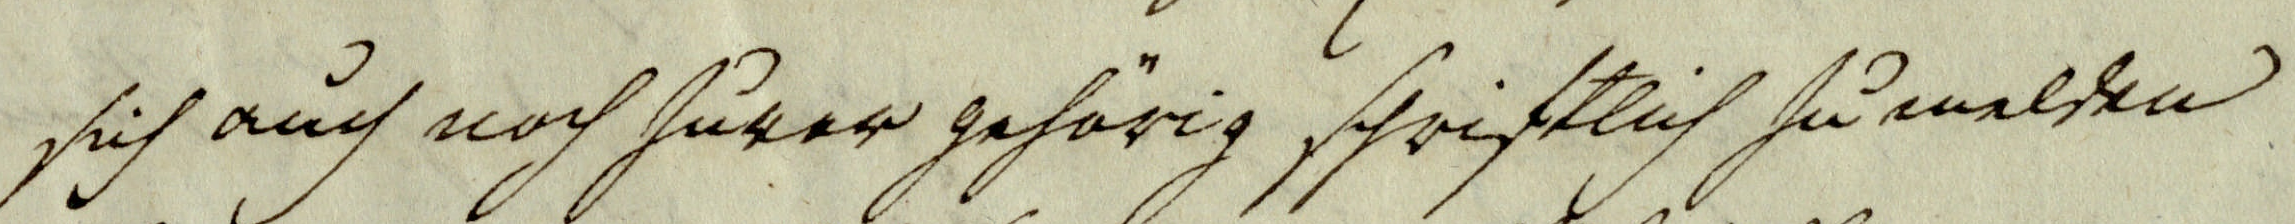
sich auch noch zuvor gehörig schriftlich zu melden
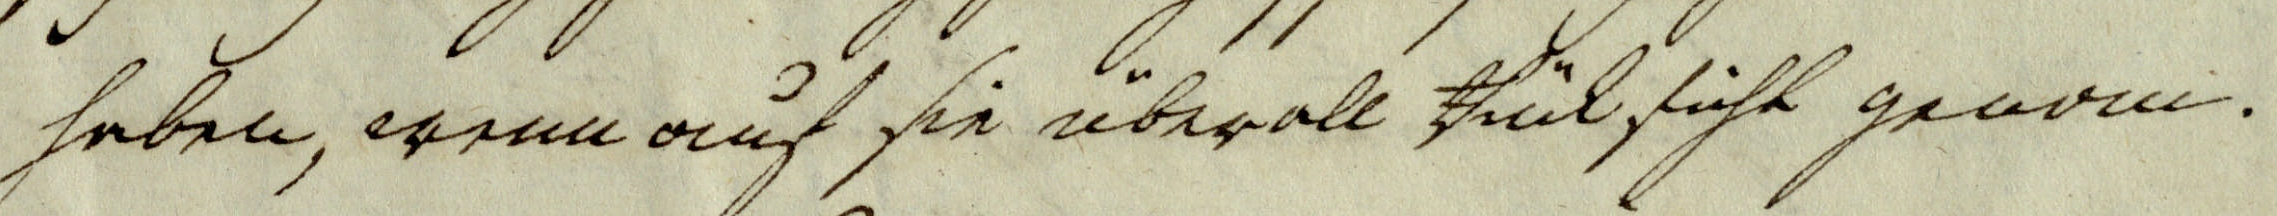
haben, wenn auf sie überall Rücksicht genom¬
